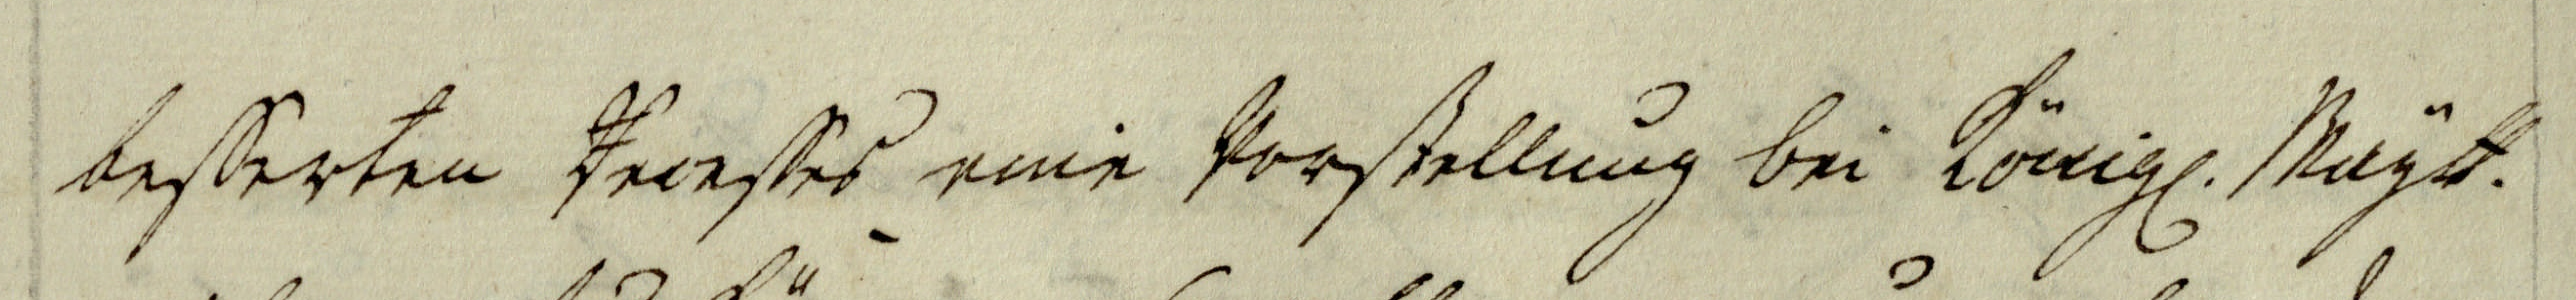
besserten Recesses eine Vorstellung bei Königl. Maÿtt.
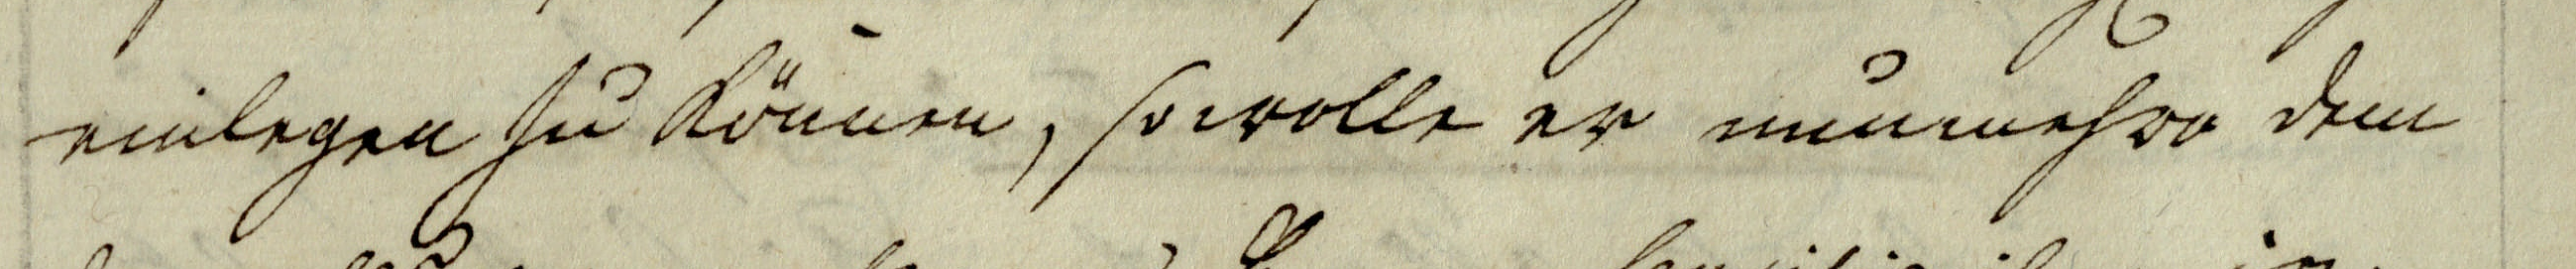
einlegen zu können, so wolle er nunmehro dem
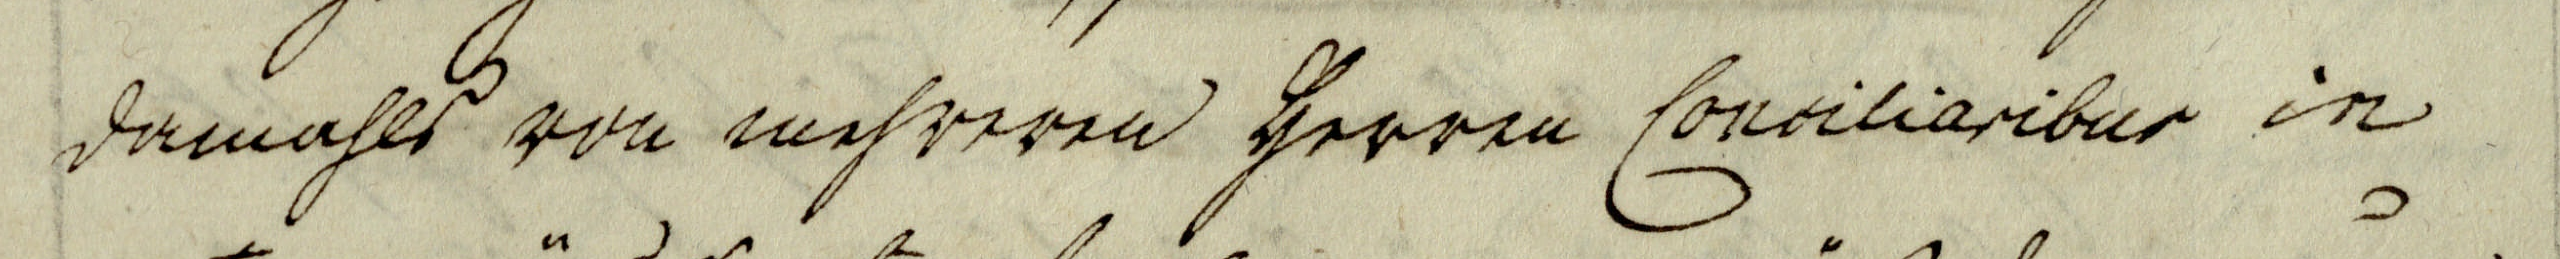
damahls von mehreren Herren Conciliaribus in
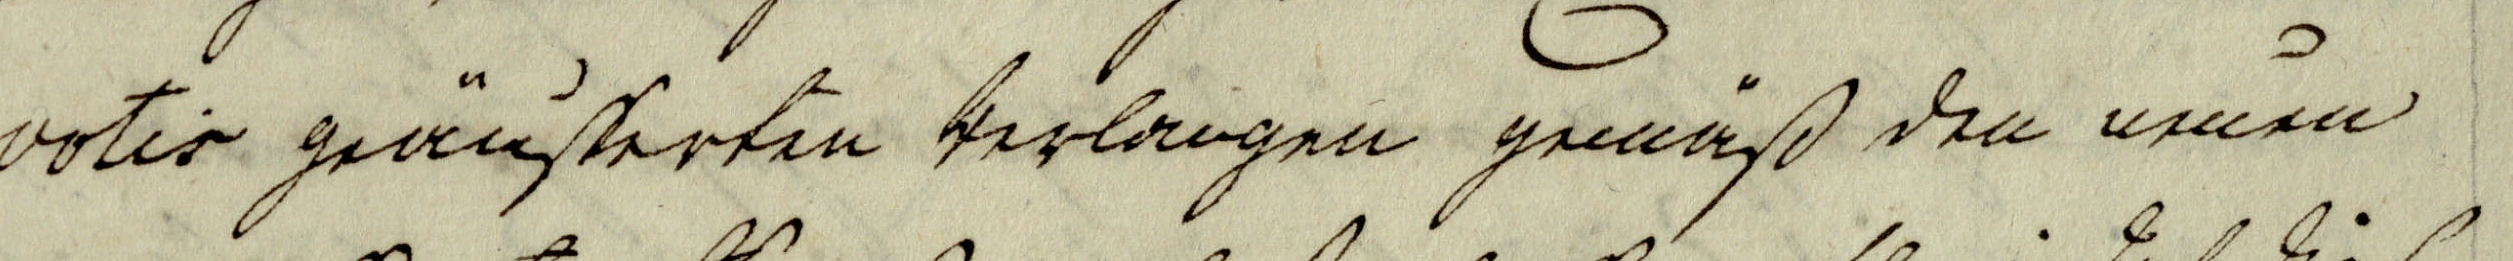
votis geäusserten Verlangen gemäß den neuen
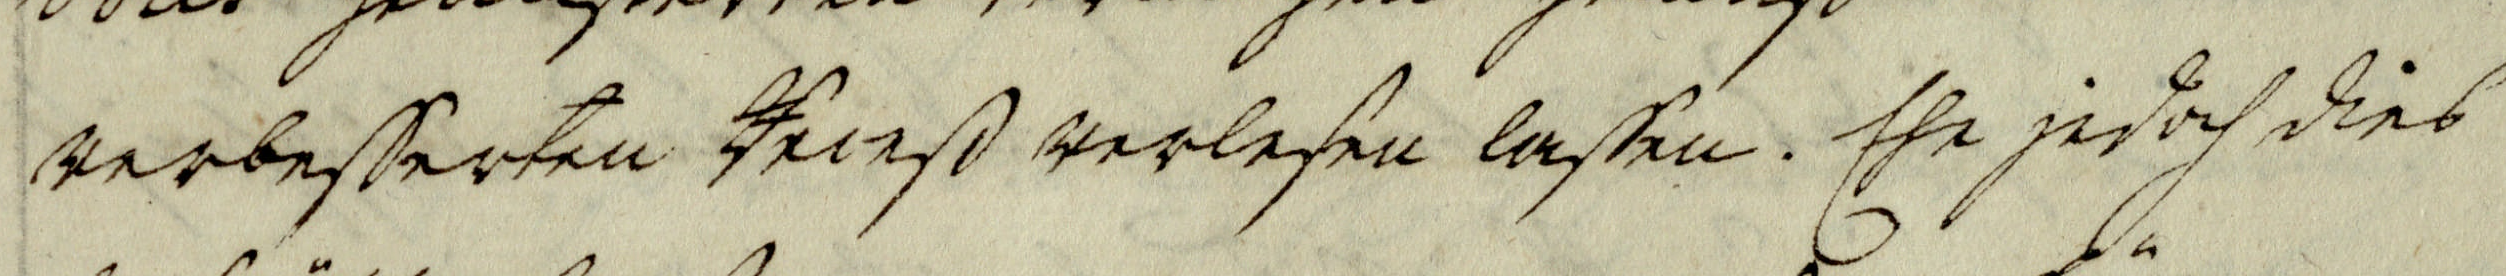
verbesserten Receß verlesen lassen. Ehe jedoch dies
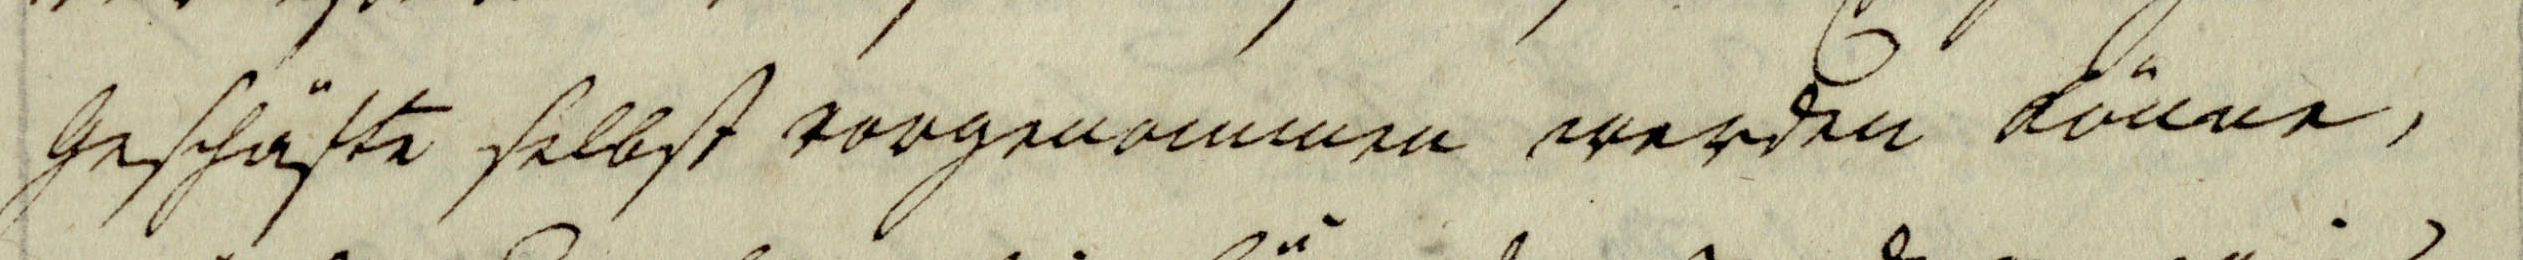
Geschäfte selbst vorgenommen werden könne,
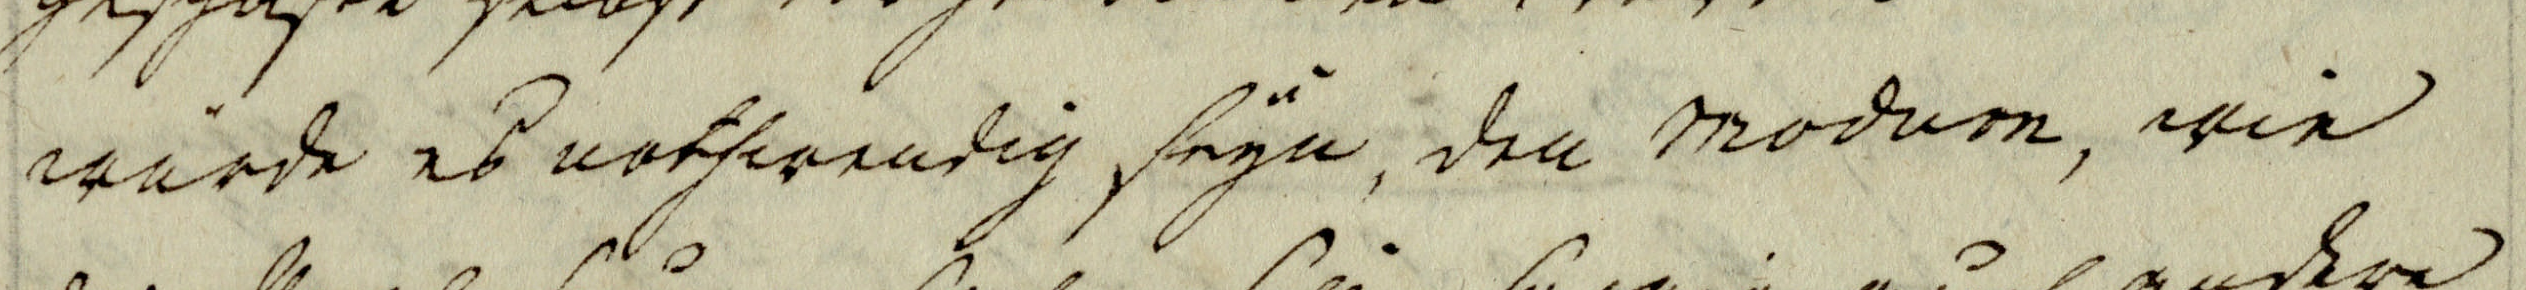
würde es nothwendig seÿn, den modum, wie
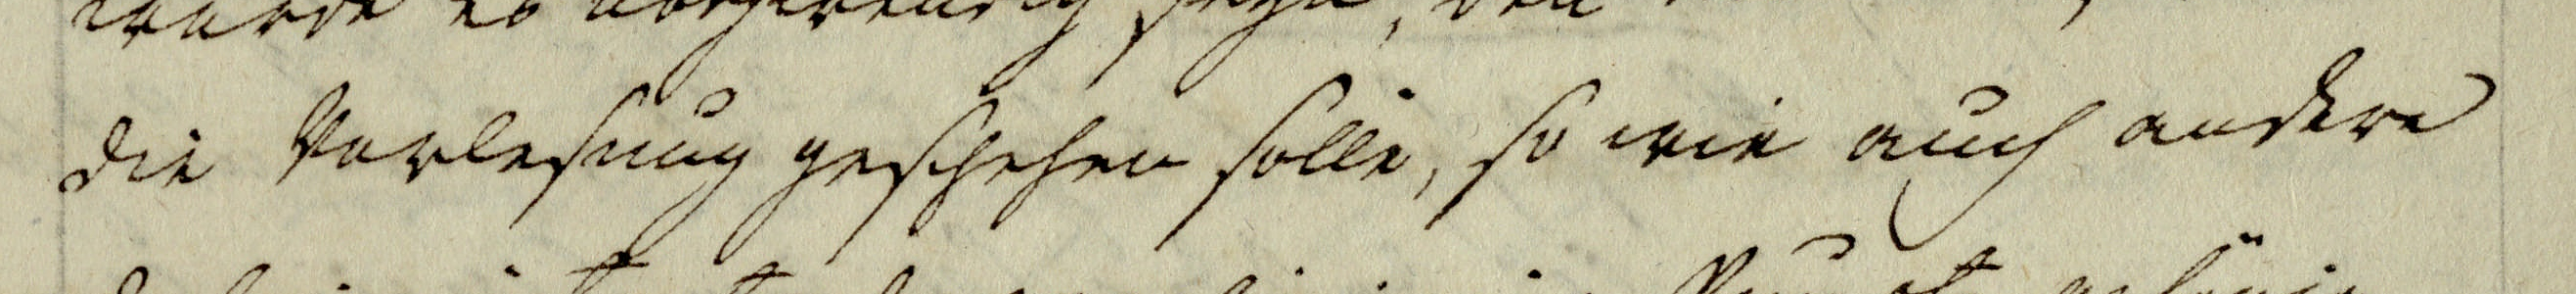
die Vorlesung geschehen solle, so wie auch andere
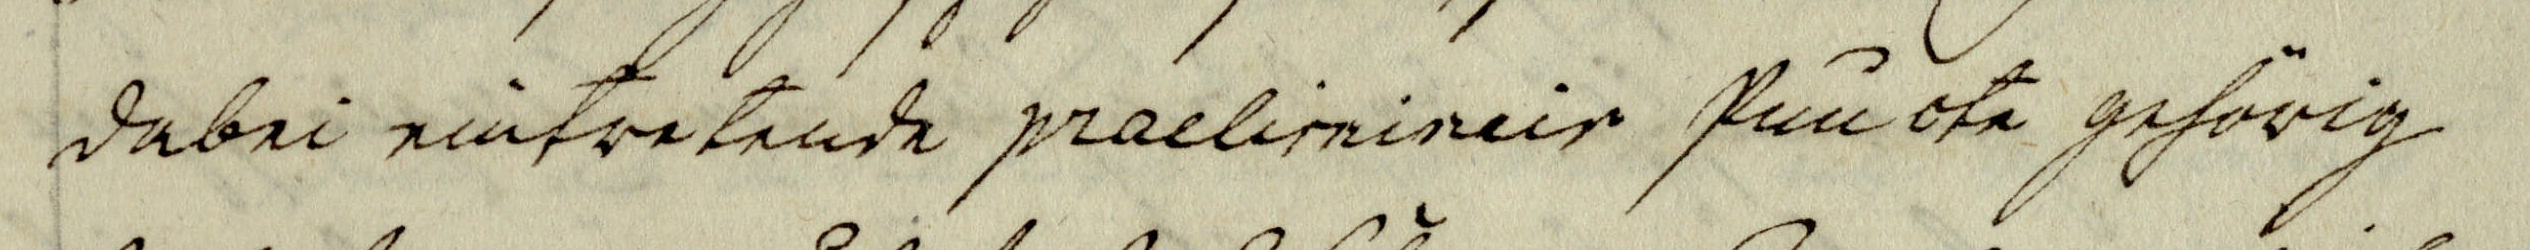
dabei eintretende praelimineir Puncte gehörig
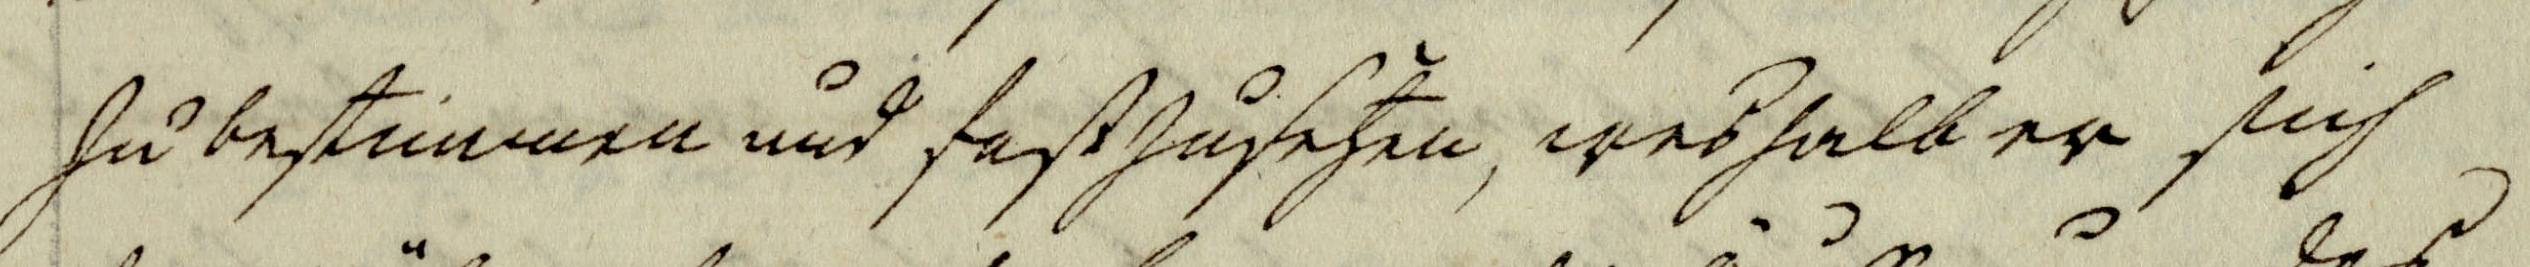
zu bestimmen und festzusetzen, weshalb er sich
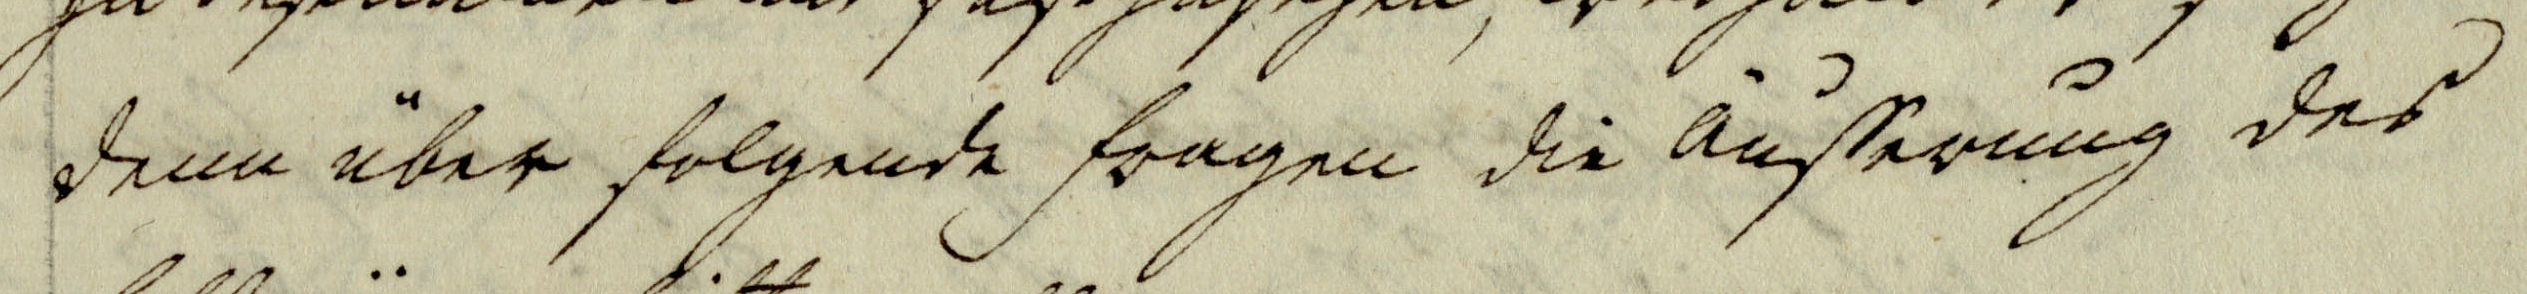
denn über folgende Fragen die Äusserung des
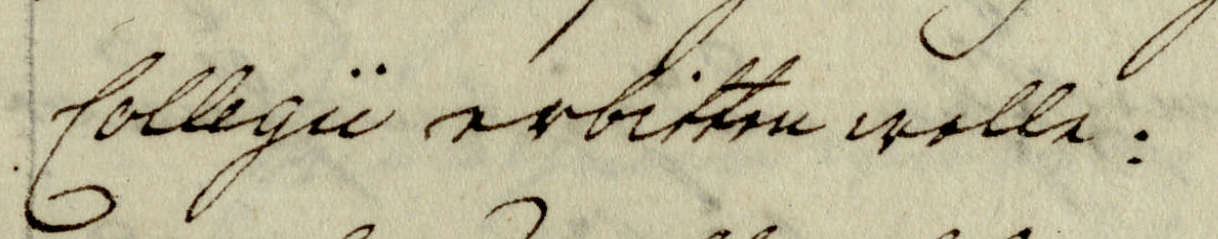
Collegii erbitten wolle:
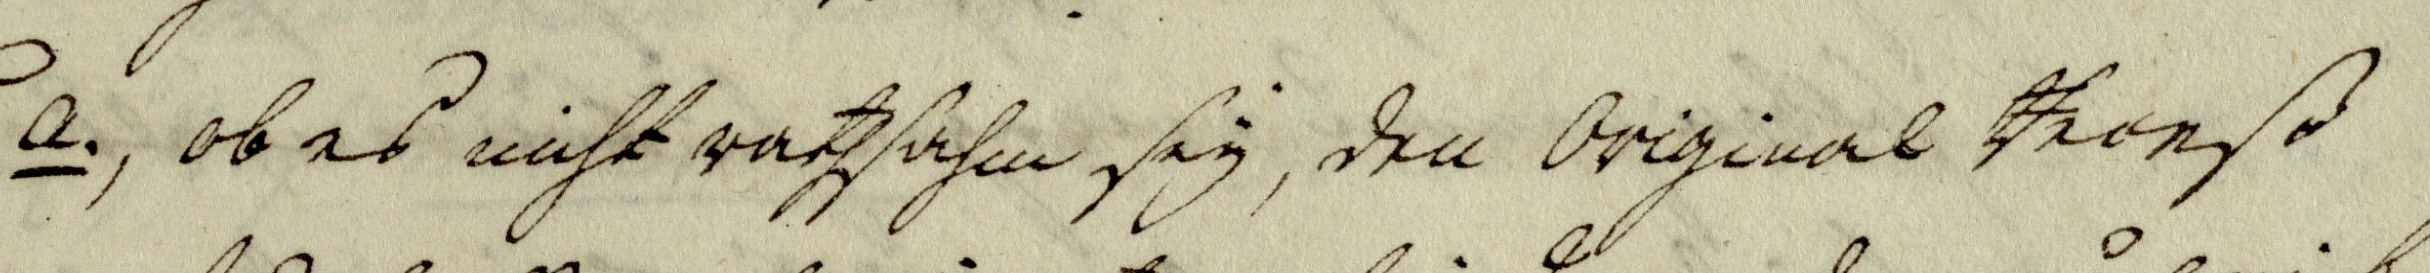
a., ob es nicht rathsahm seÿ, den Original Receß
